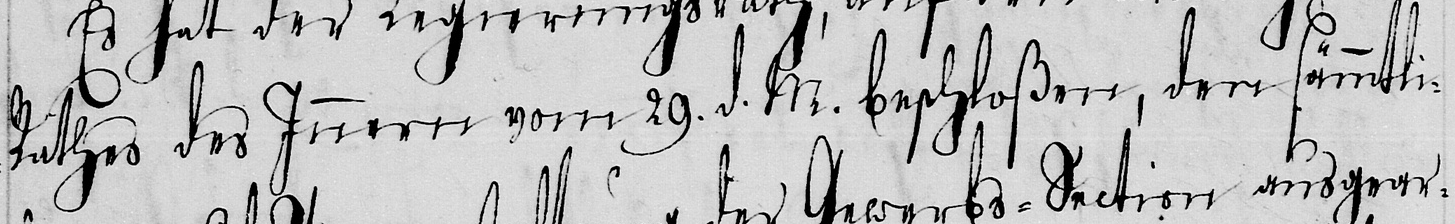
Rathes des Innern vom 29. d. M. beschloßen, den sämmtl¬
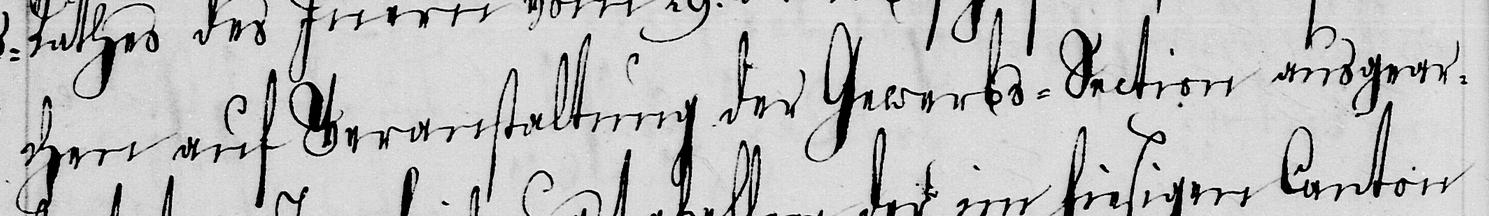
ichen auf Veranstaltung der Gewerbs-Section ausgear¬
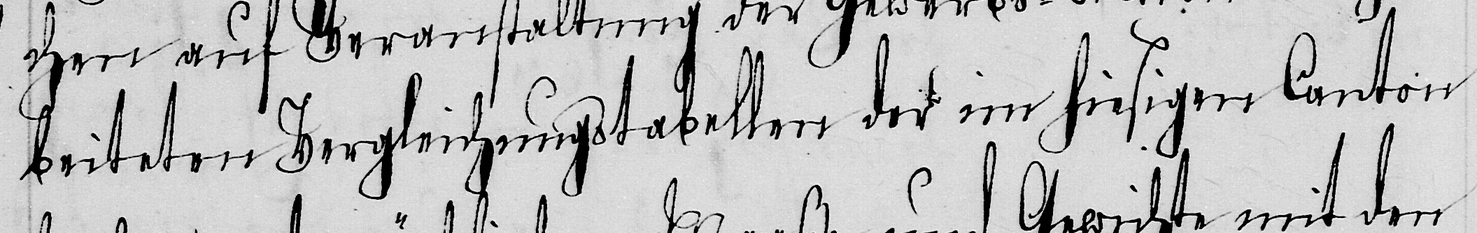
beiteten Vergleichungstabellen der im hiesigen Canton
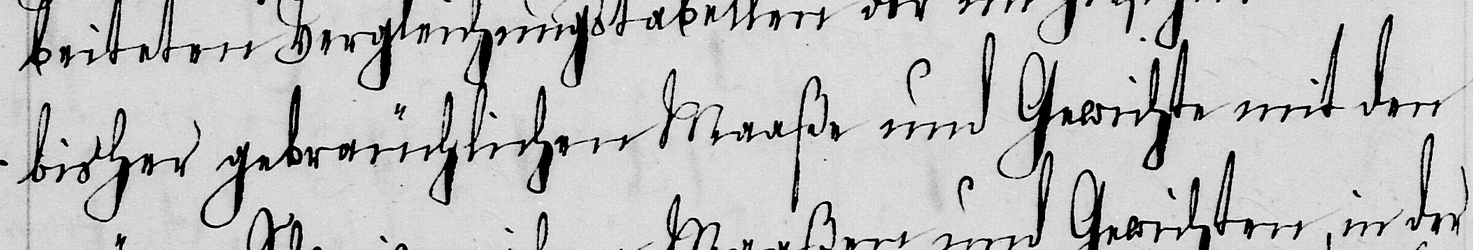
bisher gebräuchlichen Maaße und Gewichte mit den
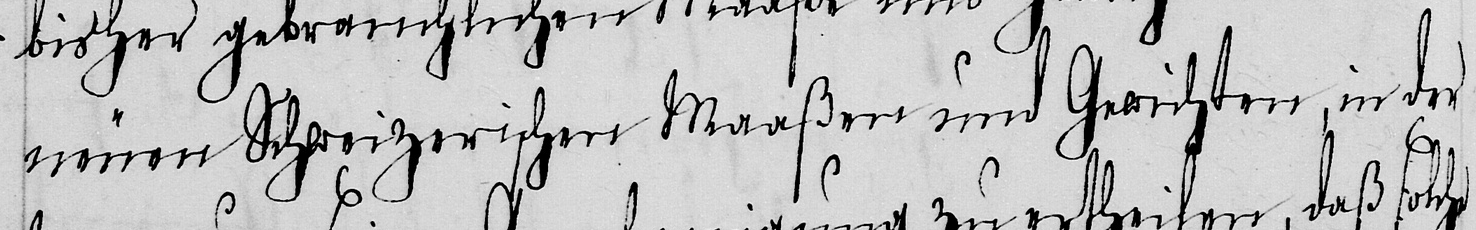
neuen Schweizerischen Maaßen und Gewichten, in der
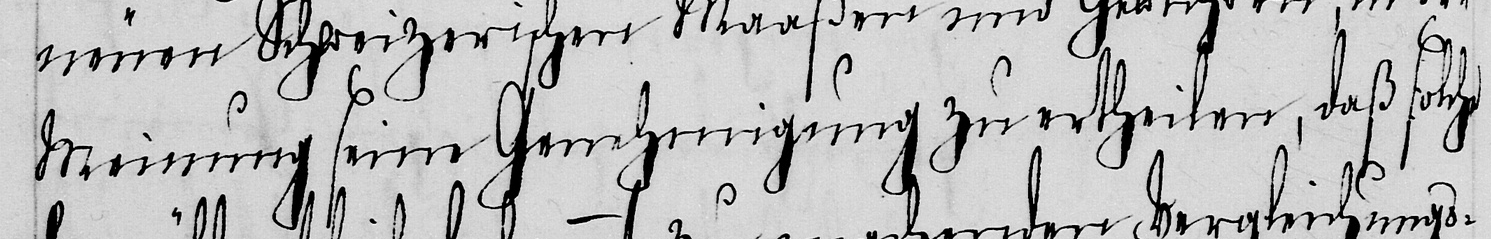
Meinung seine Genehmigung zu ertheilen, daß solc¬
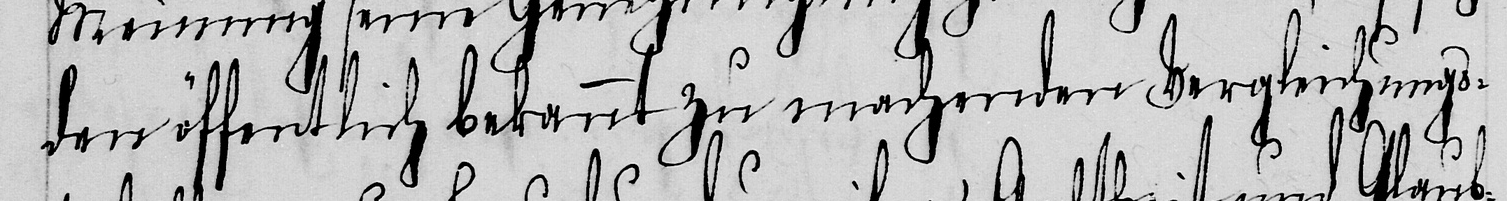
den öffentlich bekannt zu machenden Vergleichungs¬
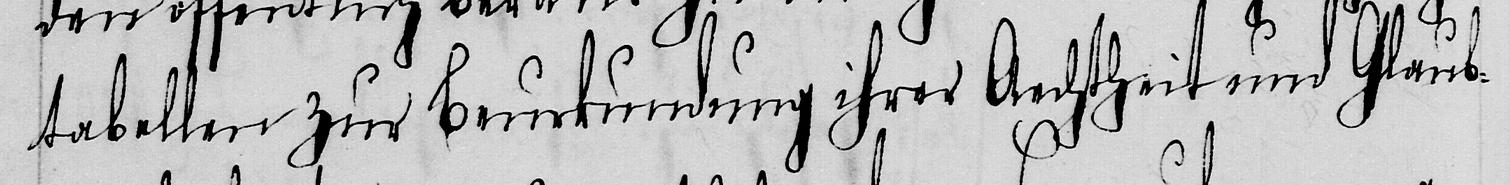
tabellen zur Beurkundung ihrer Aechtheit und Glaub¬
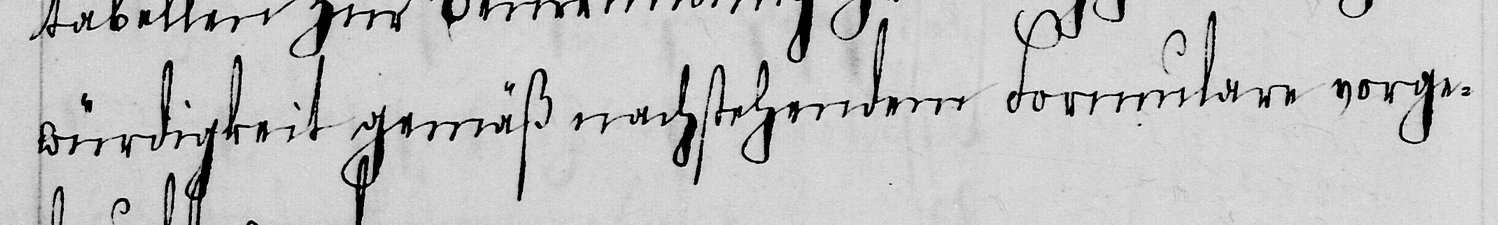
würdigkeit gemäß nachstehendem Formulare vorge¬
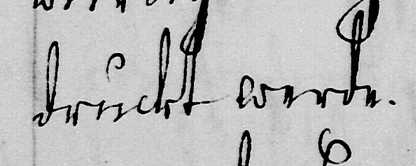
druckt werde.
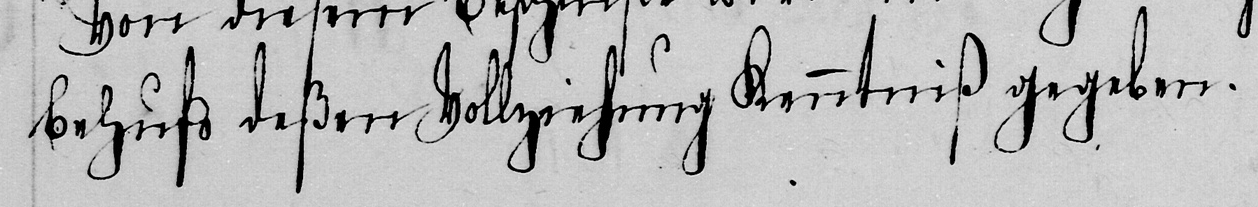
Behufs deßen Vollziehung Kenntniß gegeben.
